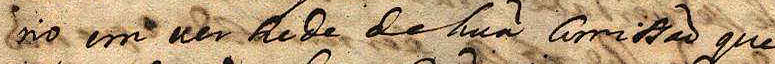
rio em uertude de huā comissão que
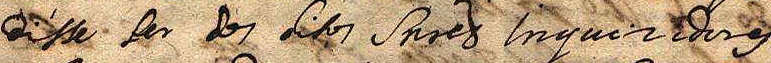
disse ter dos ditos Snres̄ Inquizidores
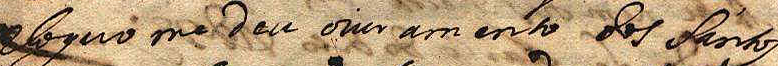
E loguo me deu o iuramento dos Santos
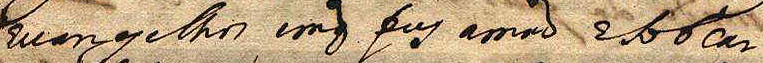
Euangelhos, em q̄ pus a mão E sob car
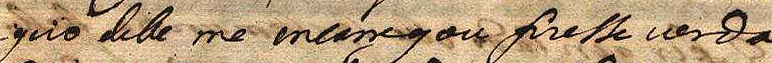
guo delle me encarregou fizesse uerda
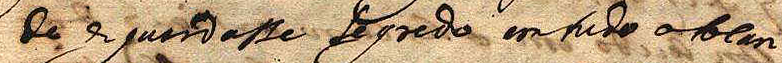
de E guardasse segredo em tudo o tocan
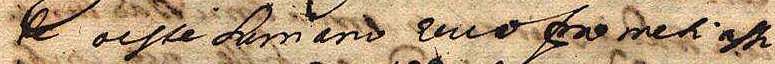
te a este Sumario E eu o prometi assi
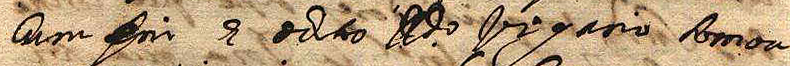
Cumprir, E o dito R.do Vigario tomou
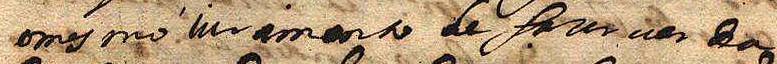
o mesmo iuramento de fazer uerda
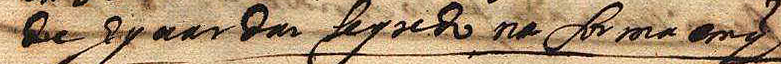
de E guardar segredo na forma em q̄
